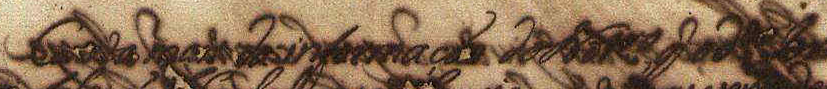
C__a m__ de informaçaõ do Notro q̄ o do Ior
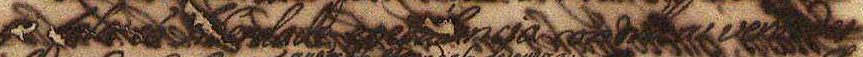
ge falar cō Verdade, e pe__encia contra as ver_des
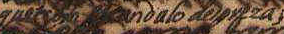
que __ndalo de preza;
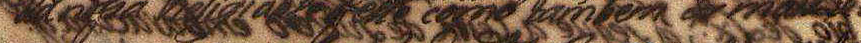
da nossa Religiaõ e q̄ elle como tambem os mais he
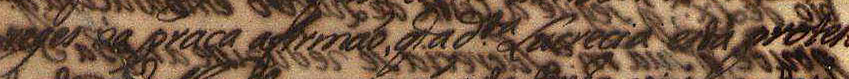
reges na praça afirmaõ q̄ a d.ta Lucrecia esta protes
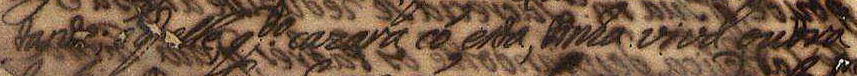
tante; e q̄ elle q.do cazara cō esta, tinha viva outra
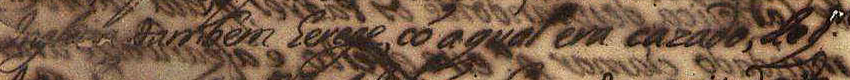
Ingleza tambem herege cō a qual era cazado, de q.m
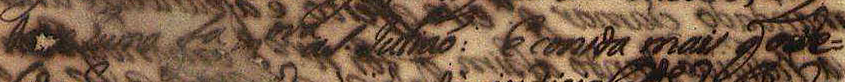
tem uma f.a m.ora a S. Iuliaõ: E consta mais q̄ o de
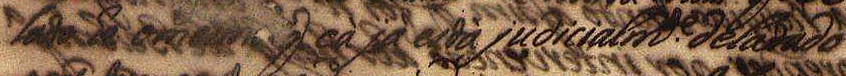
lato he o mesm_ q̄ cà já està judicialm.te delatado
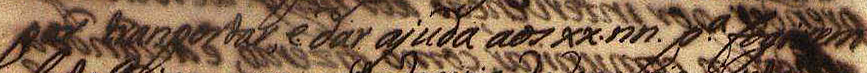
por transportar, e dar ajuda as xx. nn. p.a fogirem
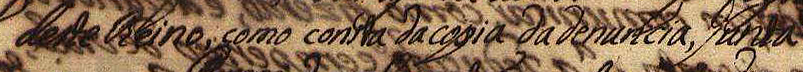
deste Reino, como consta da copia da denuncia, junta
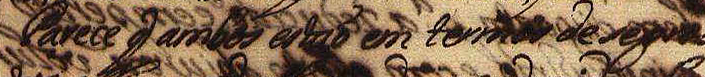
Parece q̄ ambos estaõ em termos de se pro
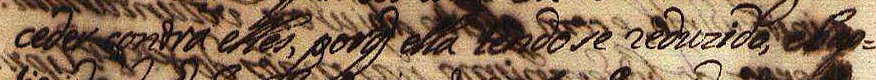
ceder contra elles, porq̄ ella tendo se reduzido, e bap
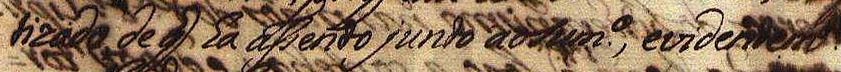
tizado de q̄ ha assento junto ao sum.o, evidentemte
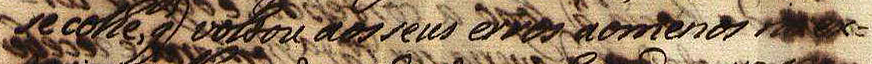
se colhe, q̄ voltou aos seus erros ao menos no ex
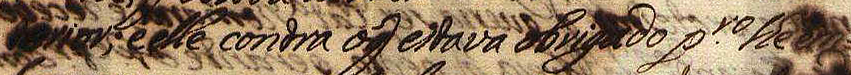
terior, e elle contra o q̄ estava obrigado p.ro lhe em
